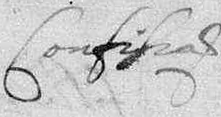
Confissaõ
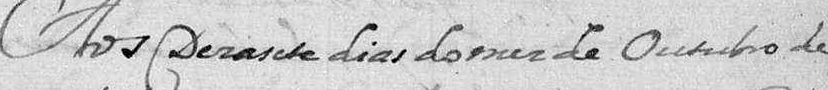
Aos Dezasete dias do mez de Outubro de
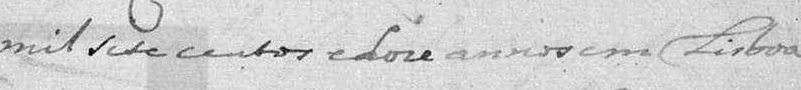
mil e setecentos e doze annos em Lisboa
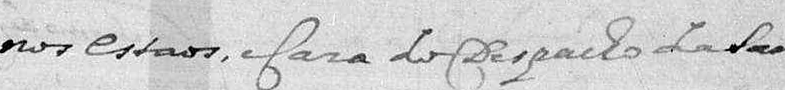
nos estaos, e Caza do Despacho da san
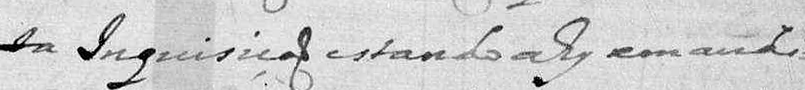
ta Inquisiçaõ estando ahy em audi
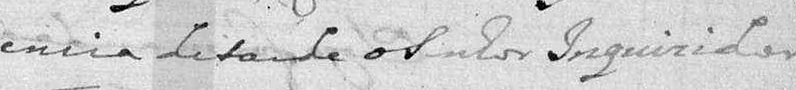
encia de tarde o Senhor Inquizidor
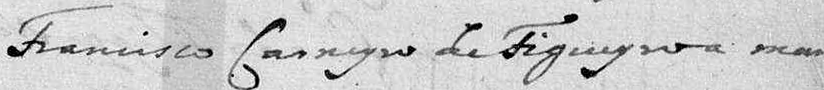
Francisco Carneyro de Figueyroa man
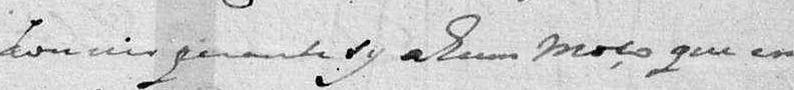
dou uir perante sy a hum moço que em
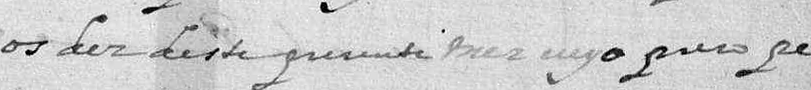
os dez deste prezente mez veyo prezo pe
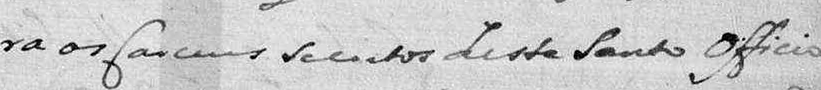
ra os Carceres secretos deste santo officio
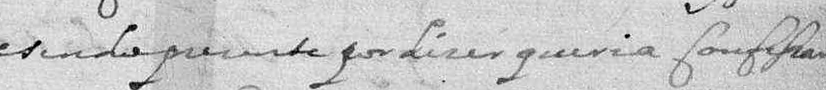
e sendo prezente por dizer queria Confessar
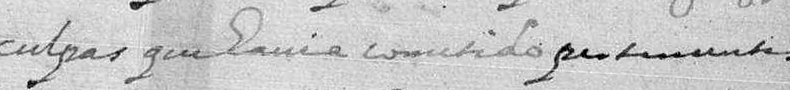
culpas que hauia cometido pertencentes
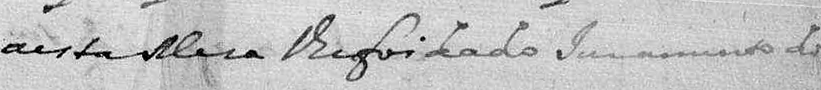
a esta Meza lhe foi dado Iuramento dos
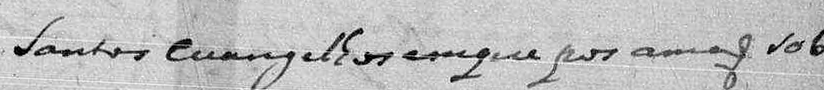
santos euangelhos em que pos a maõ sob
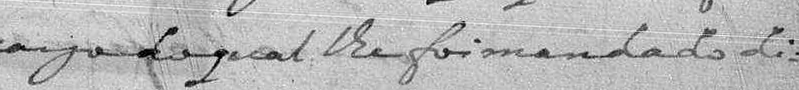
cargo do qual lhe foi mandado di
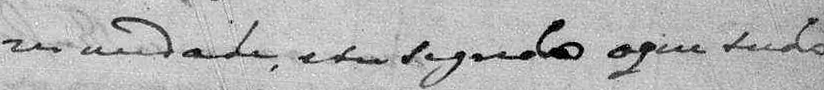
zer uerdade, e ter segredo o que tudo
